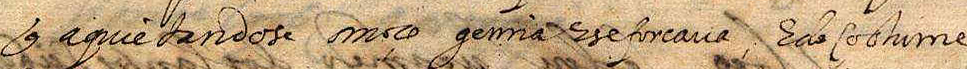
q̄ aquietandose o moço gemia e se forcaua, E de Costume
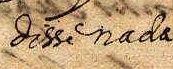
disse nada,
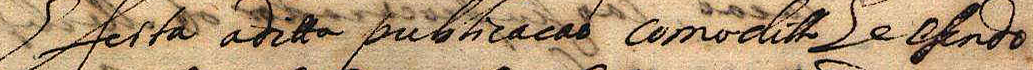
E feita a ditta publicacaõ como ditto he e sendo
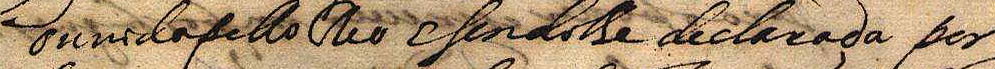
ouuida pello Reo E sendolhe declarada por
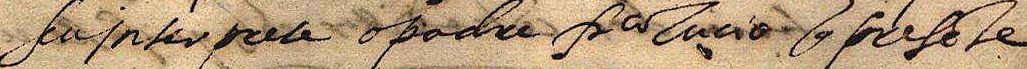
seu interprete o padre frco lucio q̄ presēte
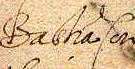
Bastião Com
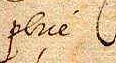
pliçe
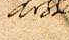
dosso
